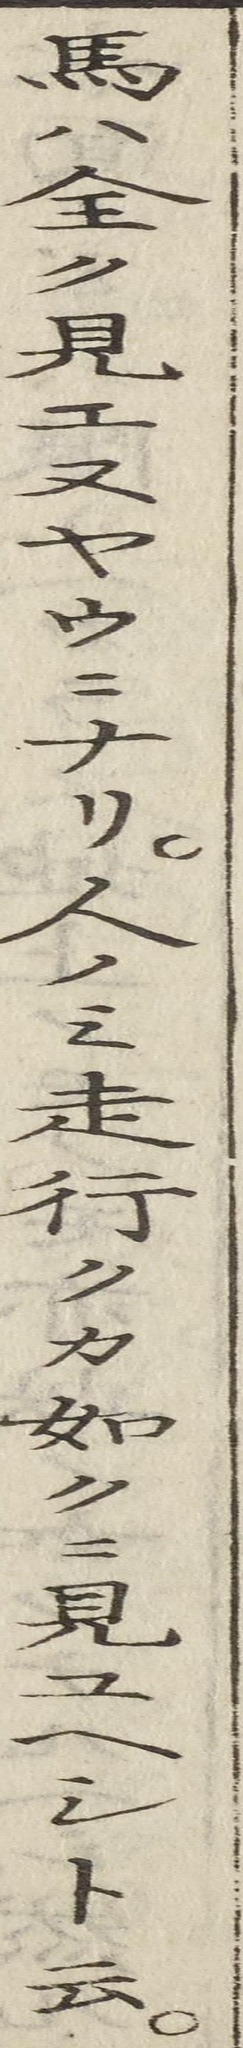馬ハ全ク見エヌヤウニナリ。人ノミ走行クカ如クニ見ユヘシト云。
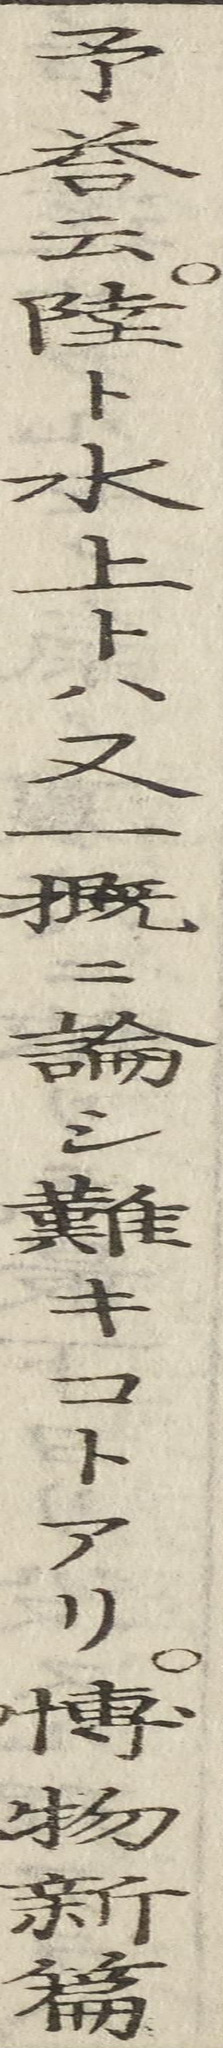予答云。陸ト水上トハ又一概ニ論シ難キコトアリ。博物新篇
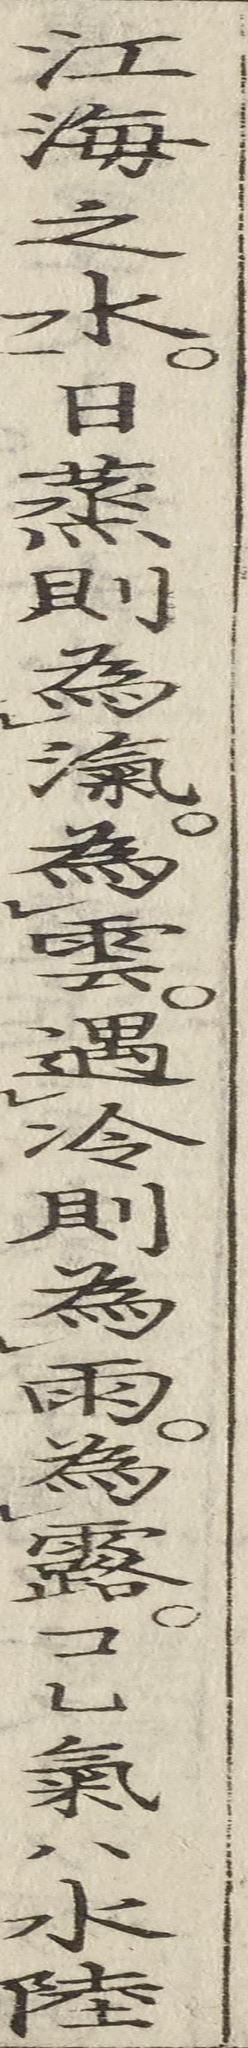江海之水。日蒸則為汽。為雲。遇冷則為雨。為露。コレ気ハ水陸
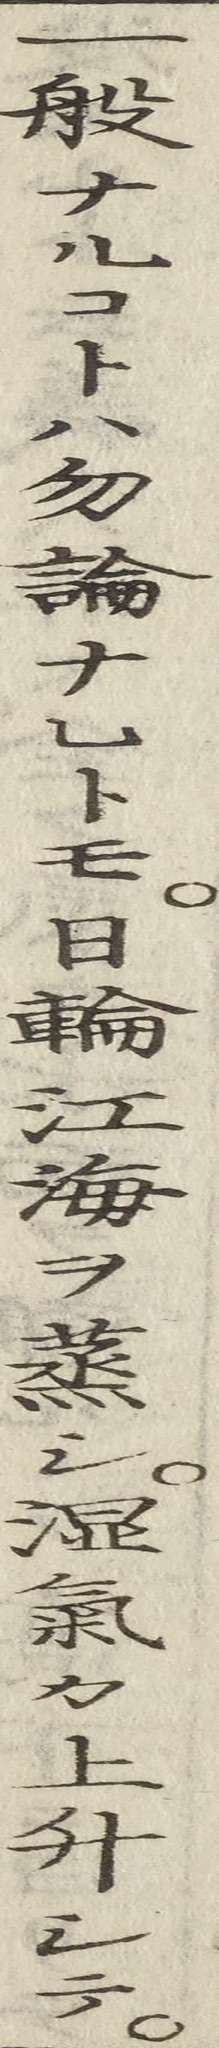一般ナルコトハ勿論ナレトモ。日輪江海ヲ蒸シ。湿気カ上昇シテ。
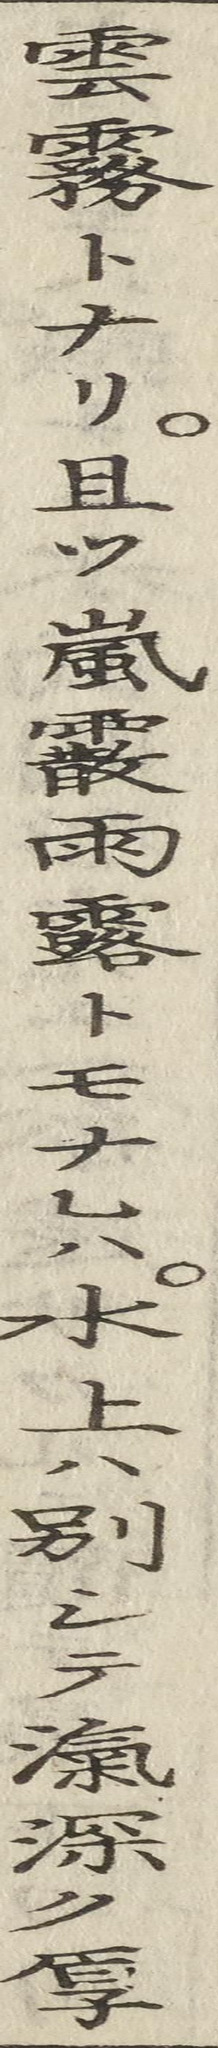雲霧トナリ。且ツ嵐霰雨露トモナレハ。水上ハ別シテ汽深ク厚
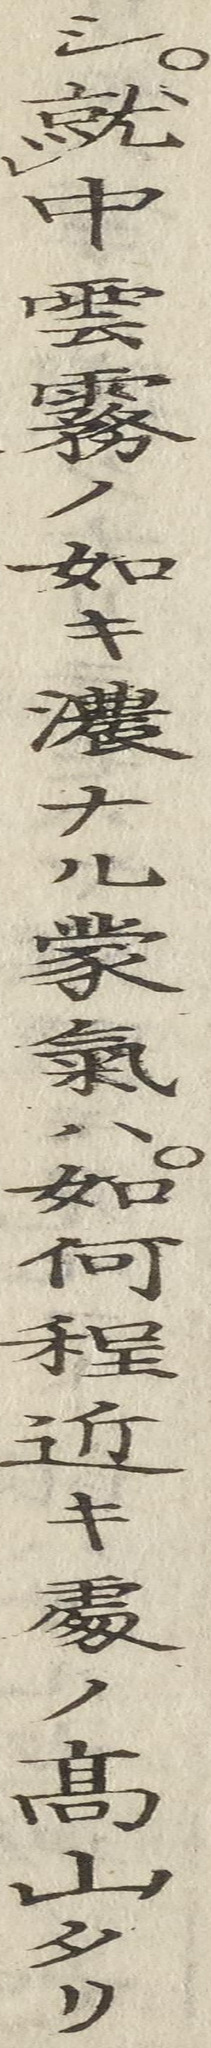シ。就中雲霧ノ如キ濃ナル蒙気ハ。如何程近キ処ノ高山タリ
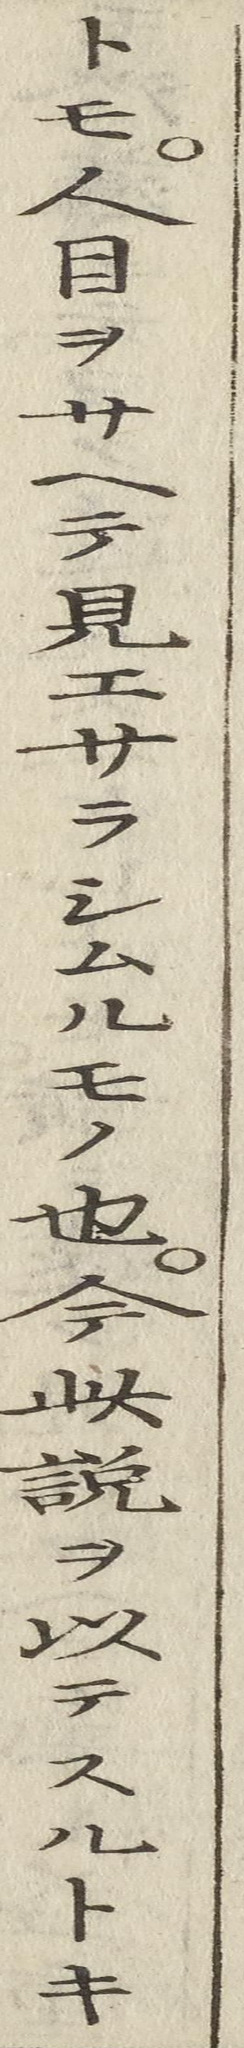トモ。人目ヲサヘテ見エサラシムルモノ也。今此説ヲ以テスルトキ
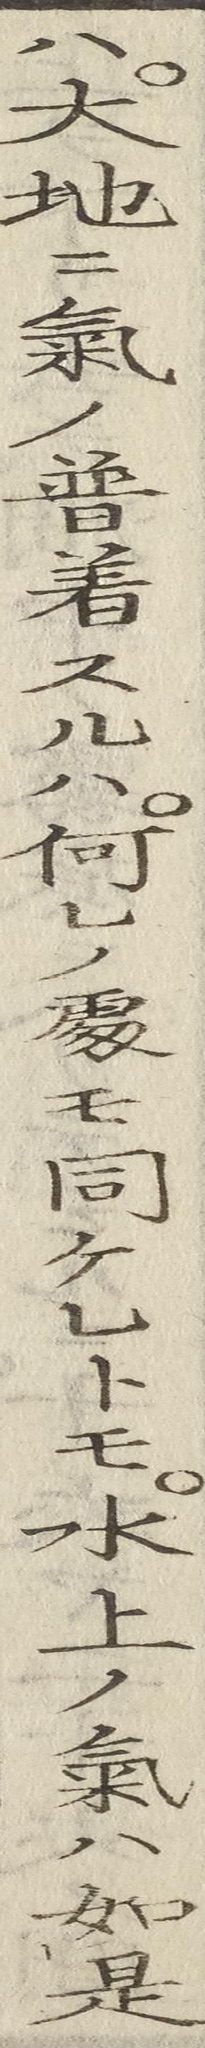ハ。大地ニ気ノ普着スルハ。何レノ処モ同ケレトモ。水上ノ気ハ如是
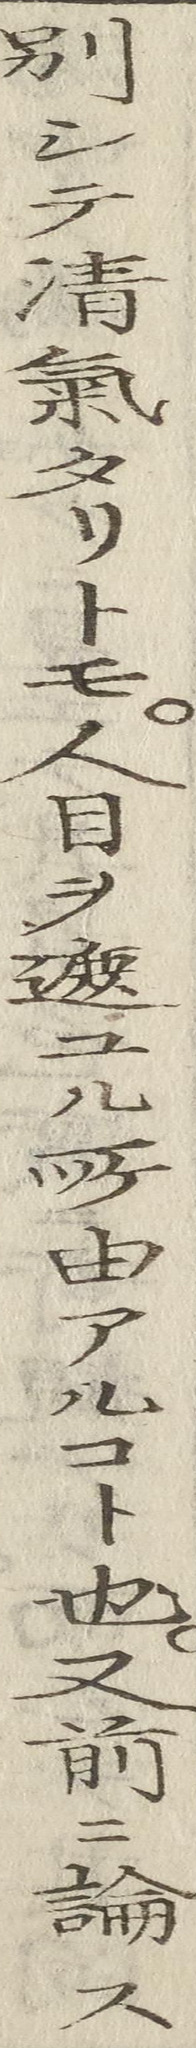別シテ清気タリトモ。人目ヲ遮ユル所由アルコト也。又前ニ論ス
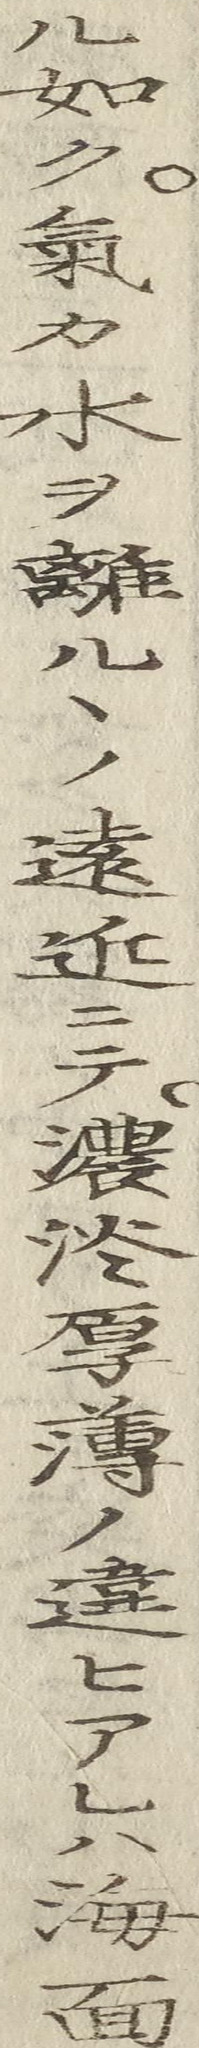ル如ク。気カ水ヲ離ルヽノ遠近ニテ。濃淡厚薄ノ違ヒアレハ海面
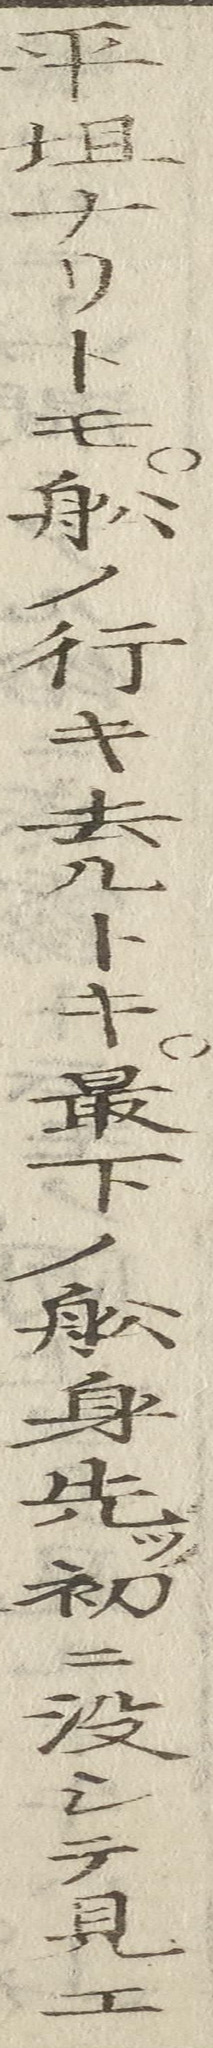平坦ナリトモ。舩ノ行キ去ルトキ。最下ノ舩身先初ニ没シテ見エ
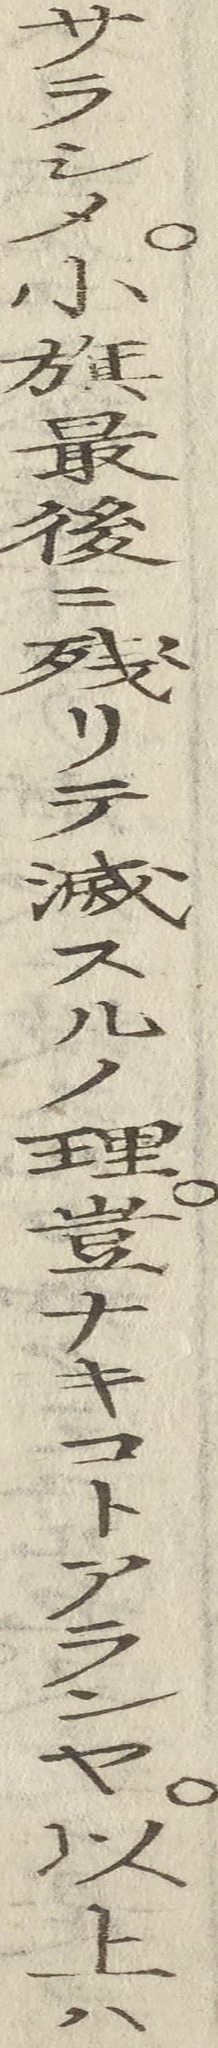サラシメ。小旗最後ニ残リテ滅スルノ理。豈ナキコトアランヤ。以上ハ
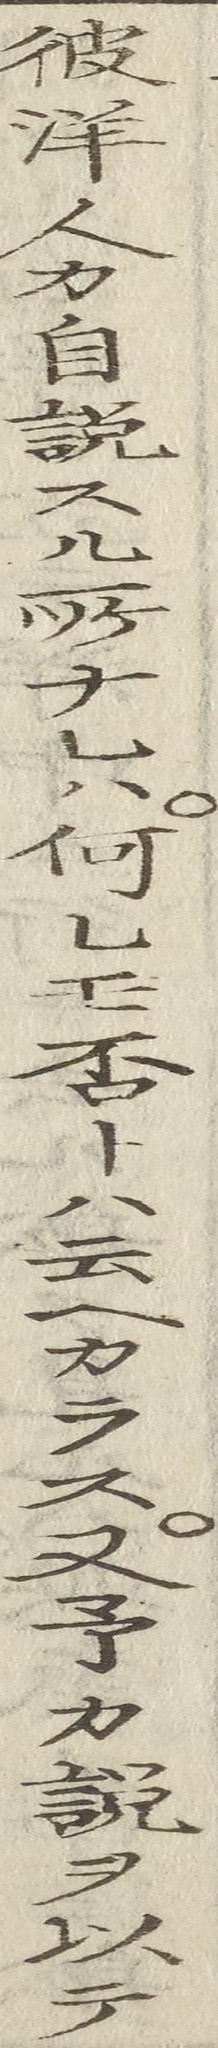彼洋人カ自説スル所ナレハ。何レモ否トハ云ヘカラス。又予カ説ヲ以テ
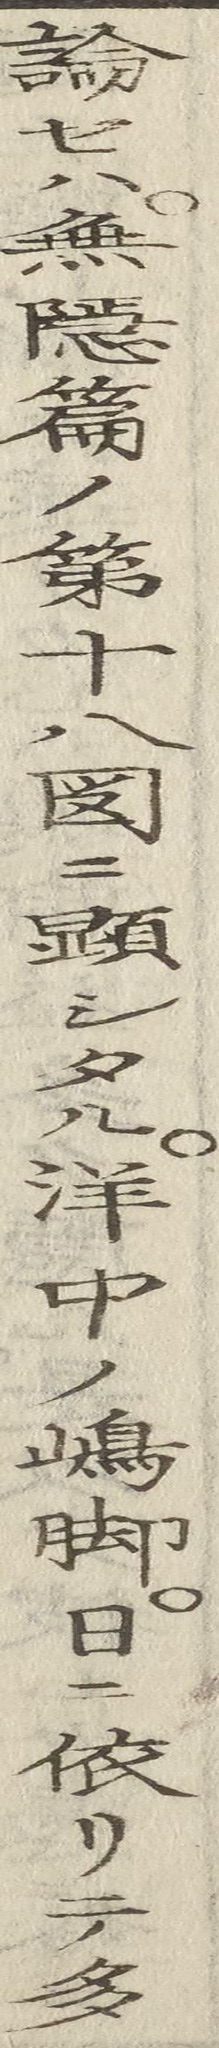論セハ。無隠篇ノ第十八図ニ顕シタル。洋中ノ嶋脚。日ニ依リテ多
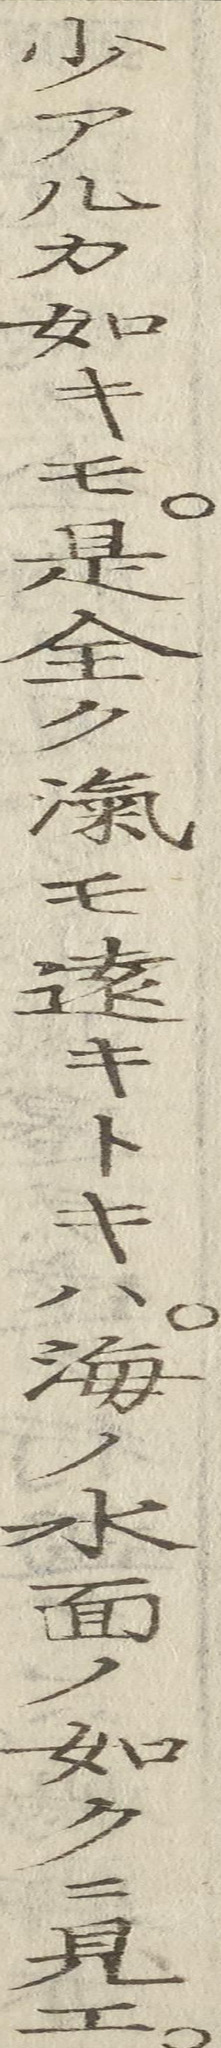少アルカ如キモ。是全ク汽モ遠キトキハ。海ノ水面ノ如クニ見エ。
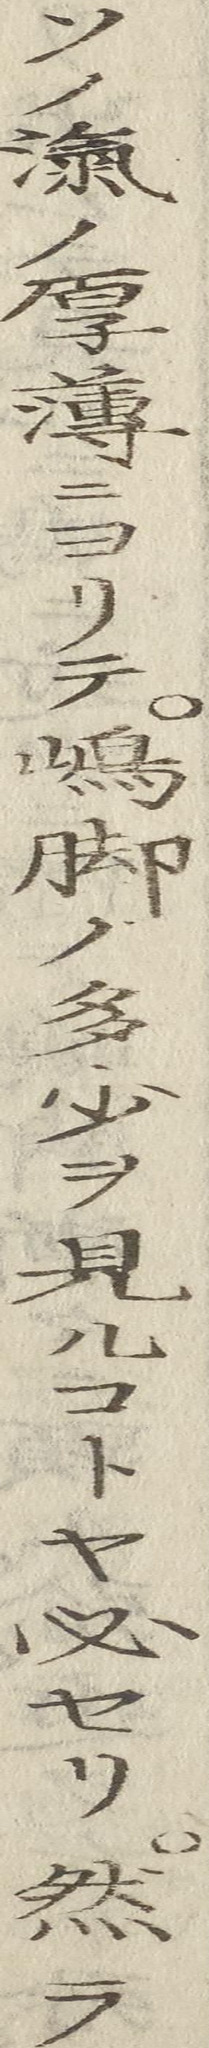ソノ汽ノ厚薄ニヨリテ。嶋脚ノ多少ヲ見ルコトヤ必セリ。然ヲ
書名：護法新論　中
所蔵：東京大学地震研究所図書室 Earthquake Research Institute Library, The University of Tokyo, JAPAN
